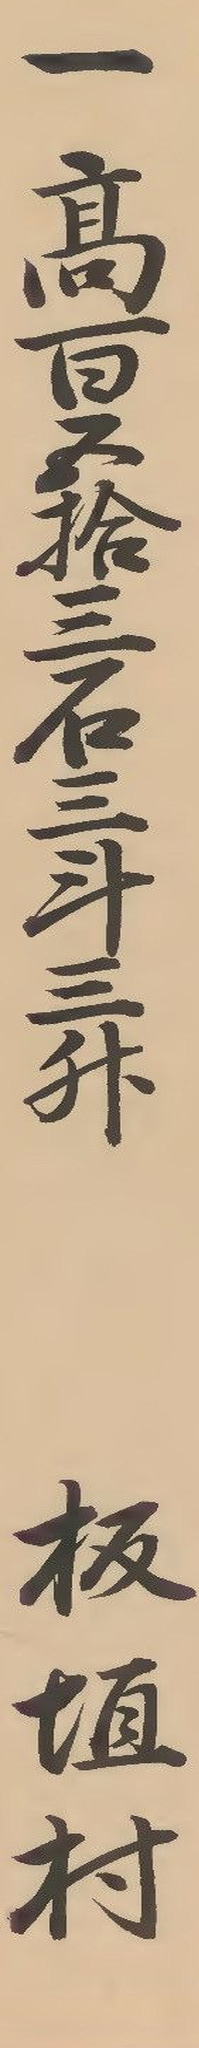一高百五拾三石三斗三升板垣村

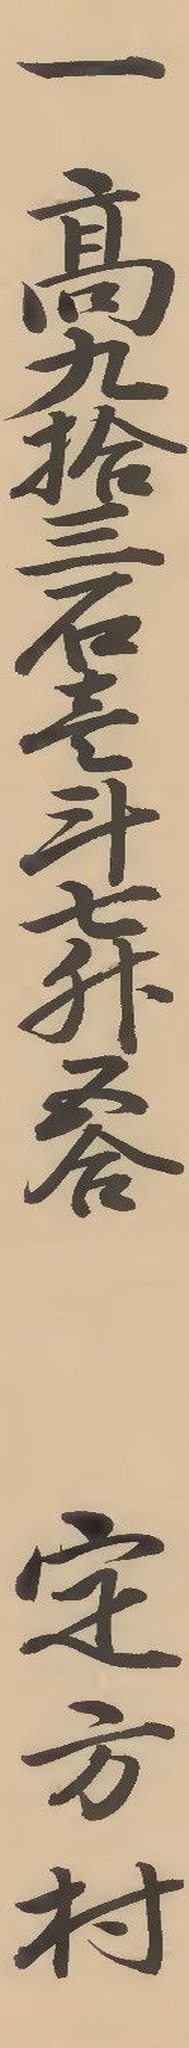一高九拾三石壱斗七升五合定方村
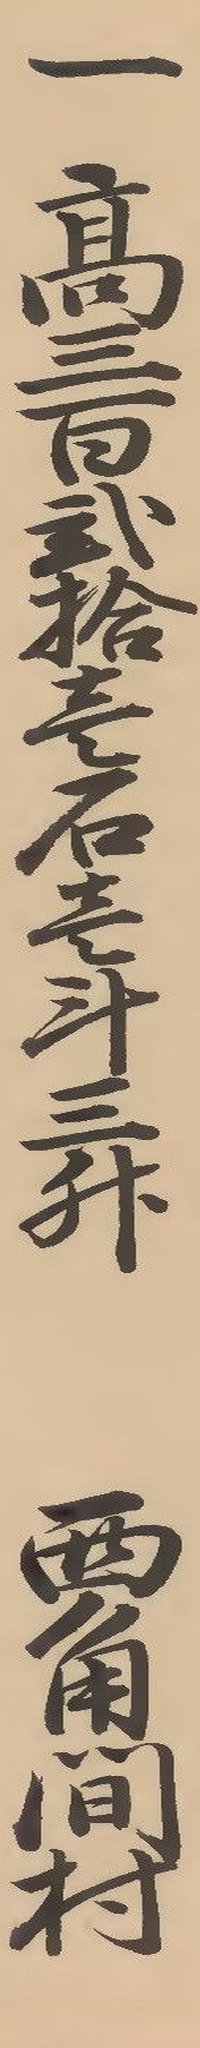一高三百弐拾壱石壱斗三升西角間村
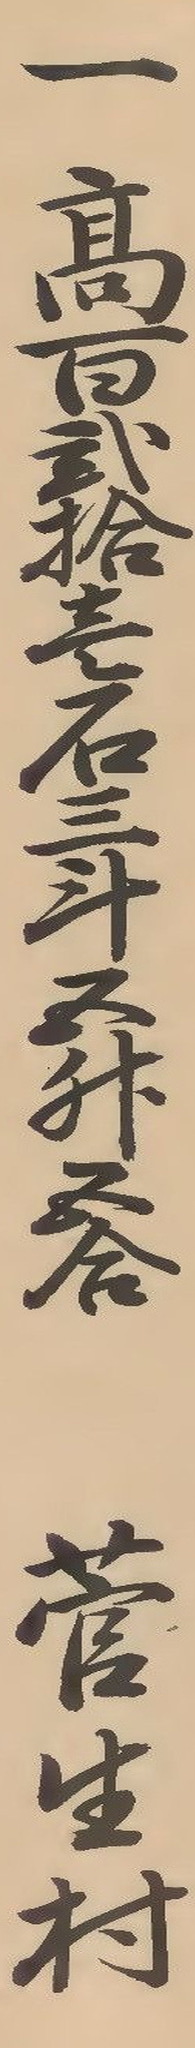一高百弐拾壱石三斗五升五合菅生村
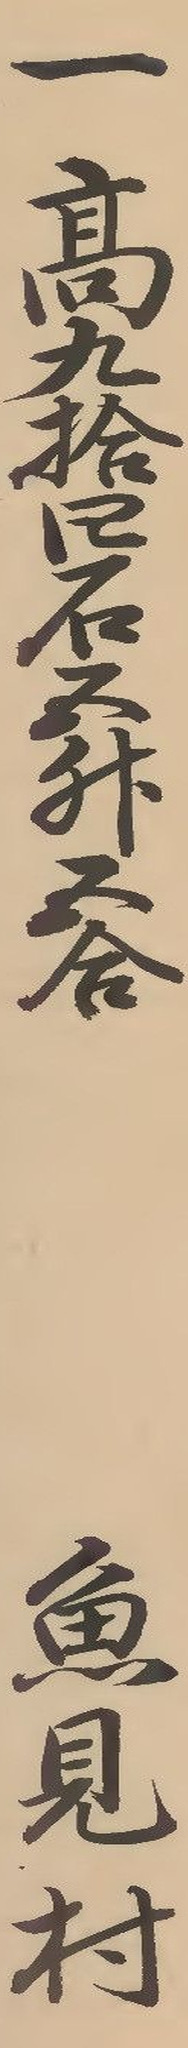一高九拾四石五升五合魚見村
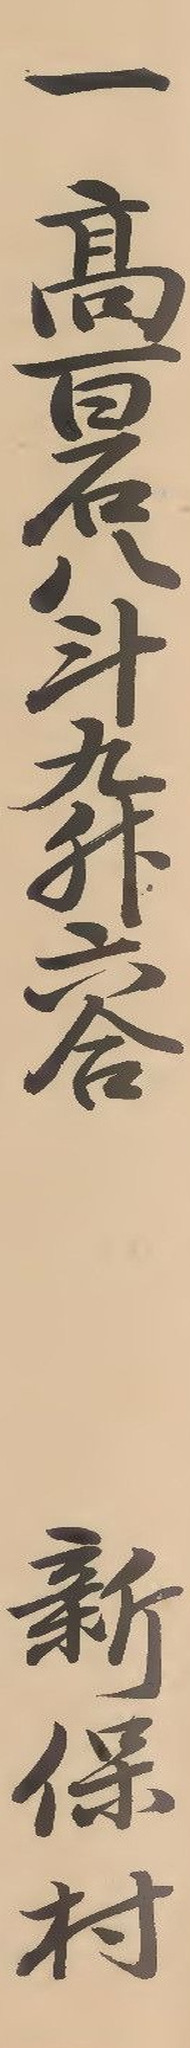一高百石八斗九升六合新保村
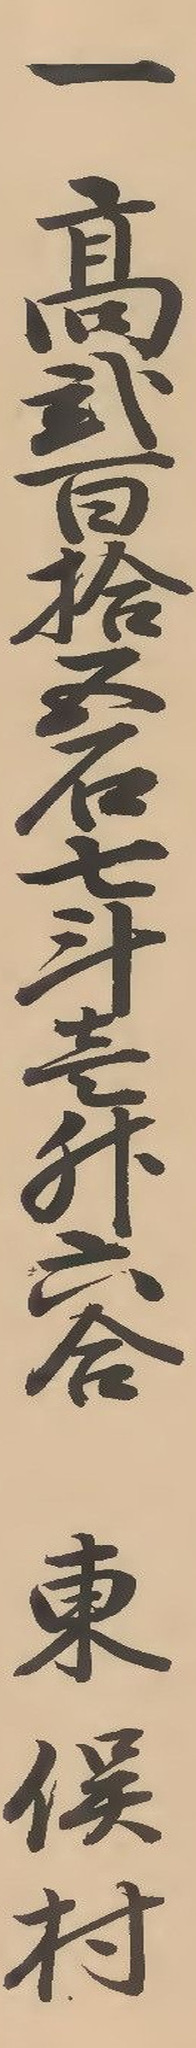一高弐百拾五石七斗壱升六合東俣村
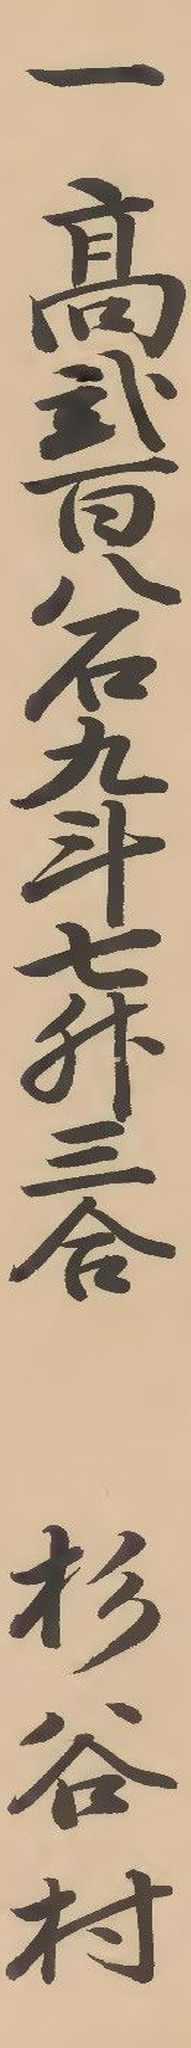一高弐百八石九斗七升三合杉谷村
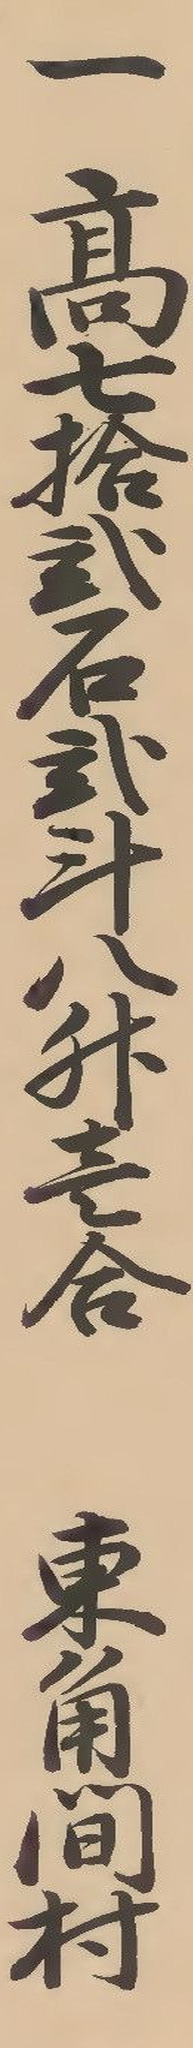一高七拾弐石弐斗八升壱合東角間村

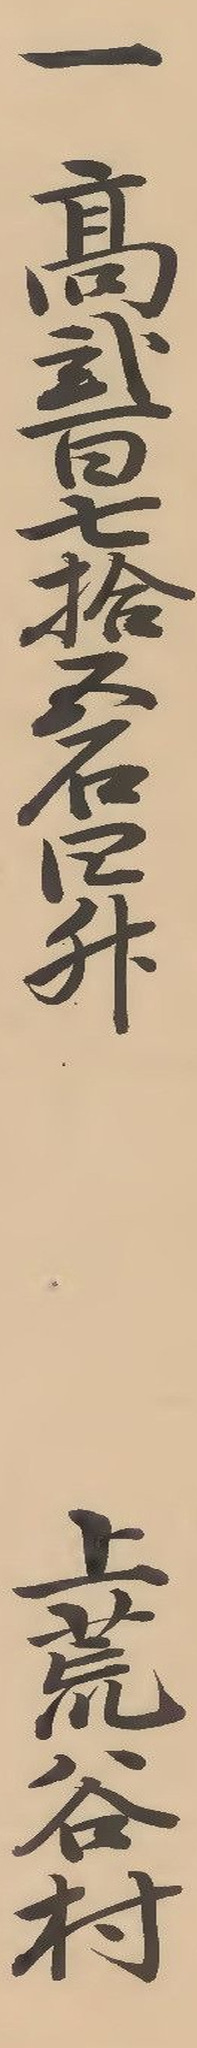一高弐百七拾五石四升上荒谷村
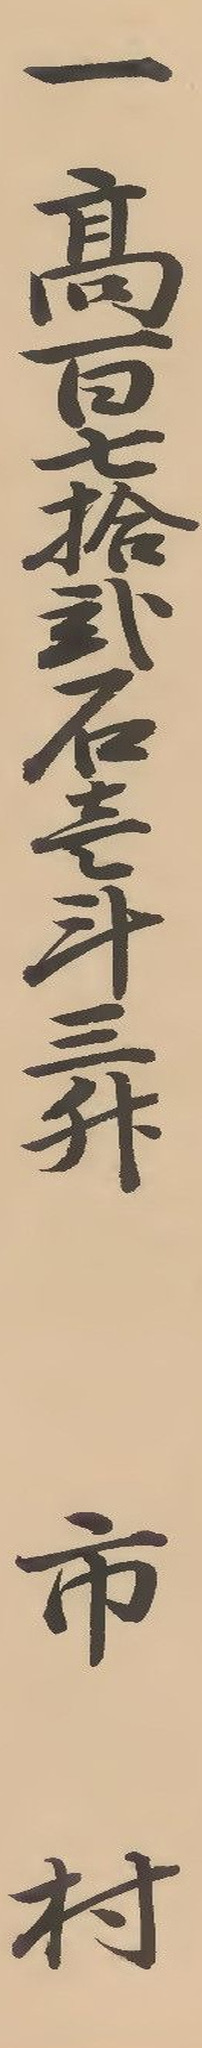一高百七拾弐石壱斗三升市村
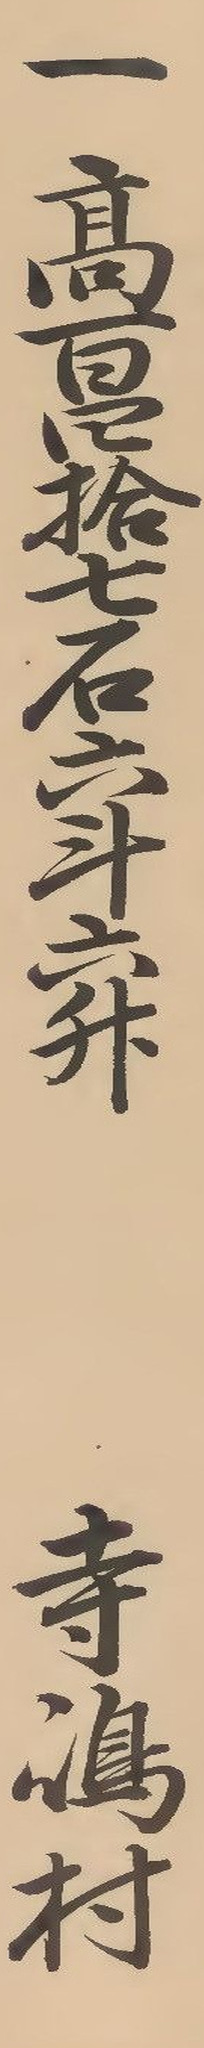一高百四拾七石六斗六升寺島村
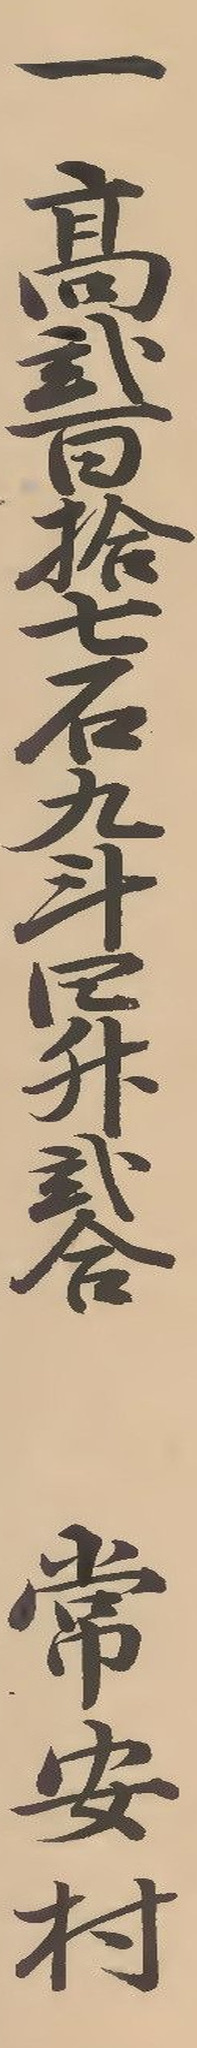一高弐百拾七石九斗四升弐合常安村

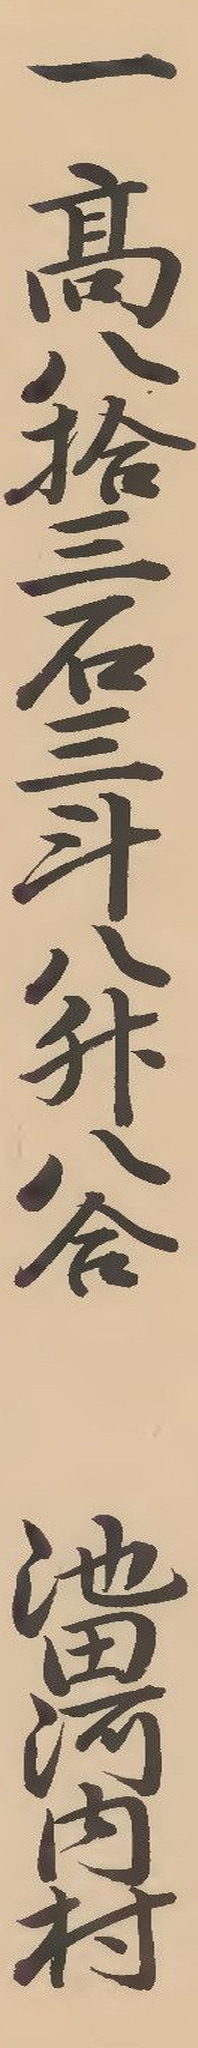一高八拾三石三斗八升八合池田河内村
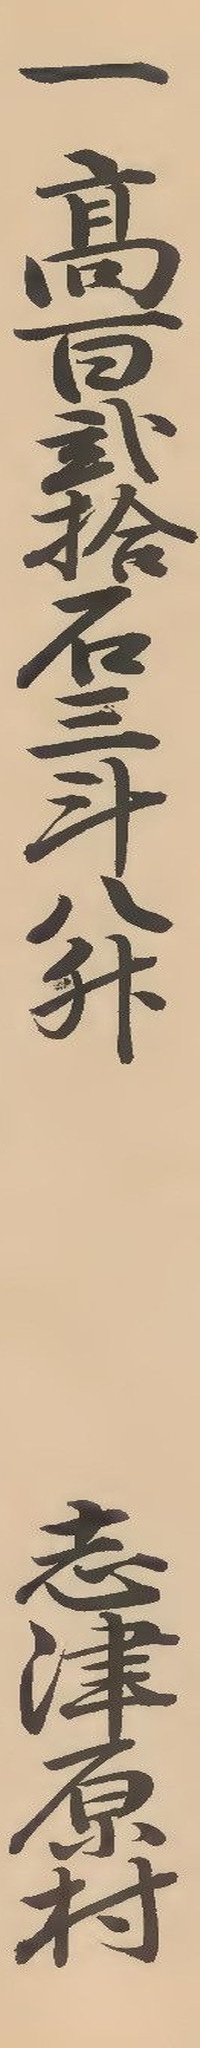一高百弐拾石三斗八升志津原村
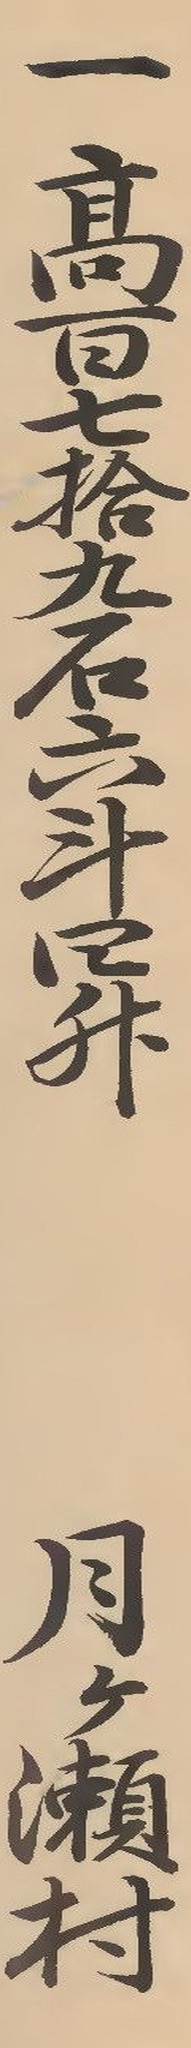一高百七拾九石六斗四升月ヶ瀬村
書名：越前国郷帳
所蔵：国立公文書館 National Archives of Japan
